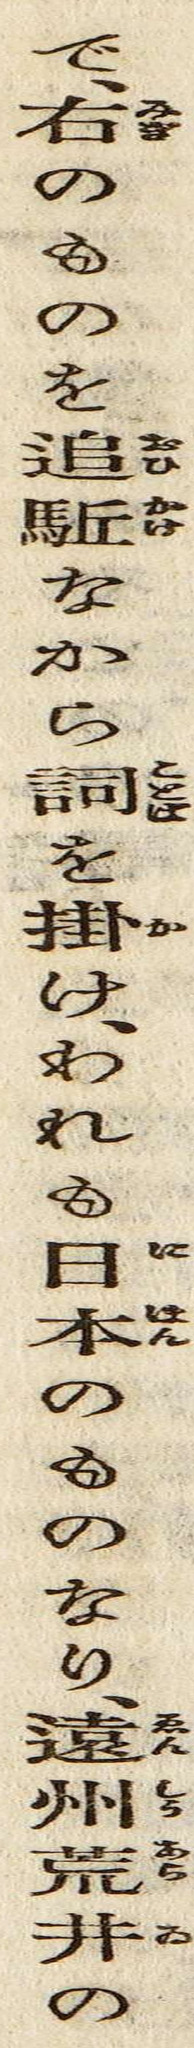で、右のものを追駈なから詞を掛け、われも日本のものなり、遠州荒井の
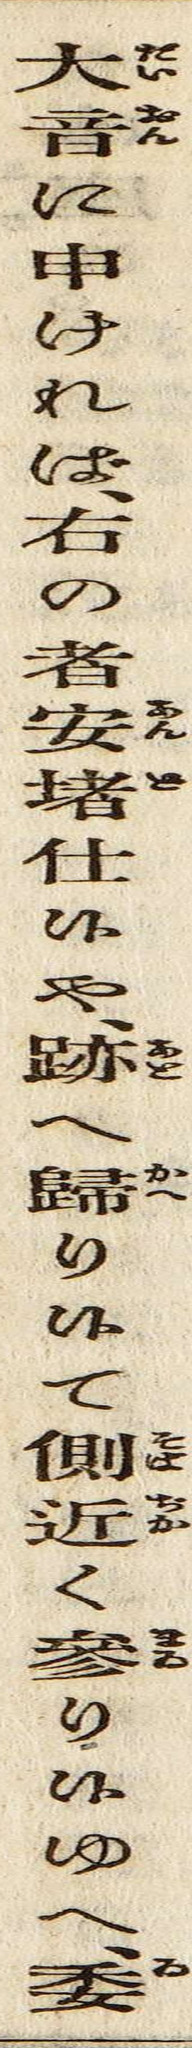大音に申ければ、右の者安堵仕候や、跡へ帰り候て側近く参り候ゆへ、委
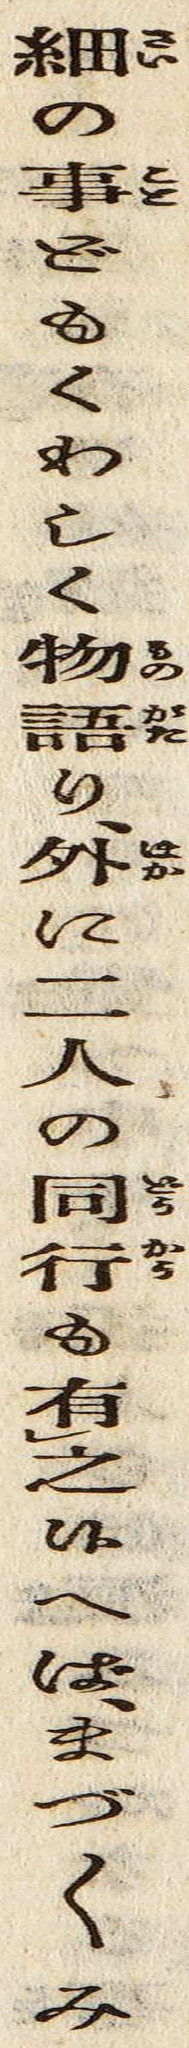細の事どもくわしく物語り、外に二人の同行も有之候へば、まづ〳〵み
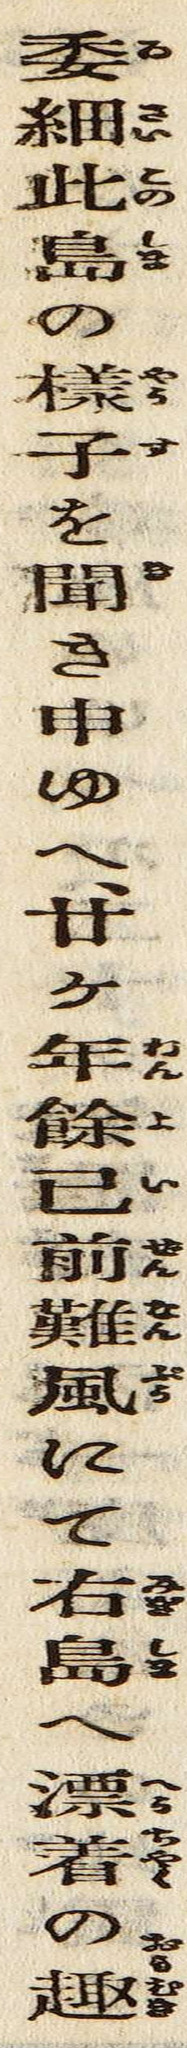委細此島の様子を聞き申ゆへ、廿ケ年余已前難風にて右島へ漂着の趣
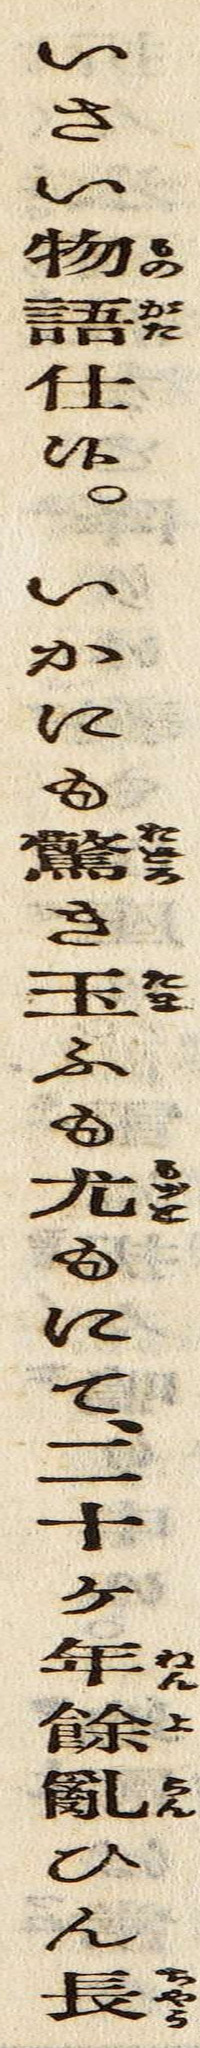いさい物語仕候。いかにも驚き玉ふも尤もにて、二十ケ年余乱ひん長

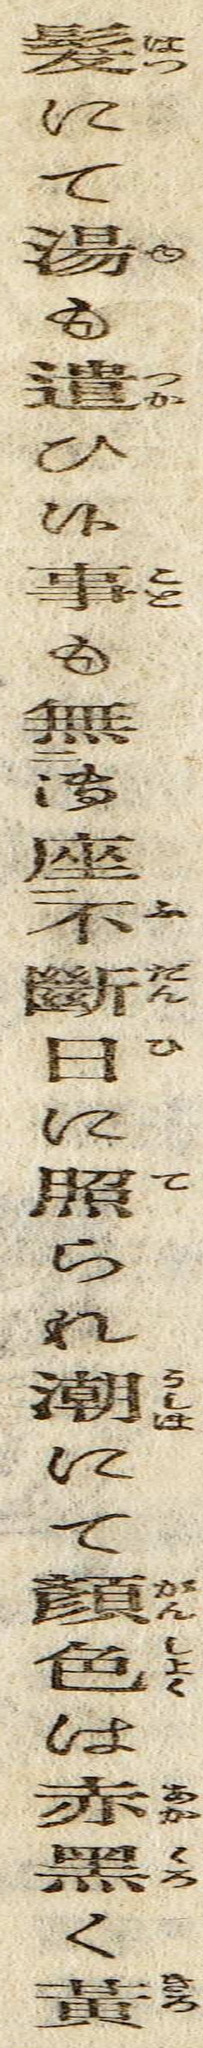髪にて湯も遣ひ候事も無御座不断日に照られ潮にて顔色は赤黒く黄
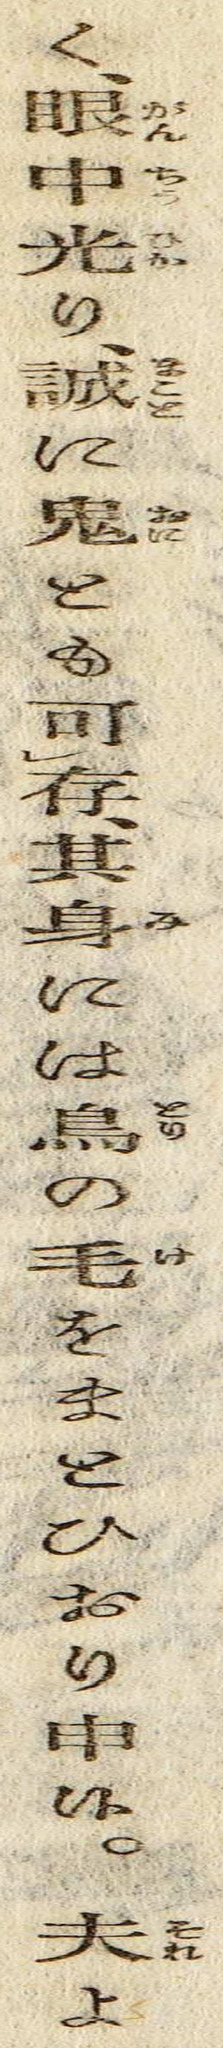く、眼中光り、誠に鬼とも可存、其身には鳥の毛をまとひおり申候。夫よ
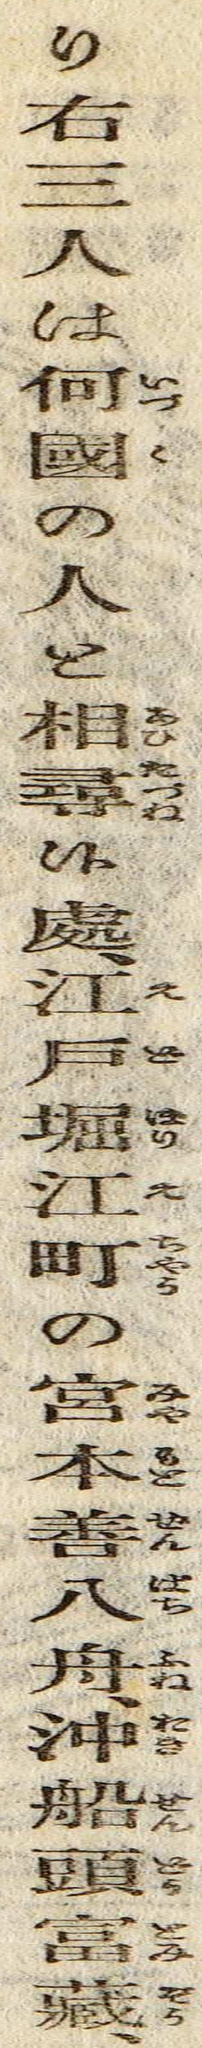り右三人は何国の人と相尋候処、江戸堀江町の宮本善八舟、沖船頭富蔵、
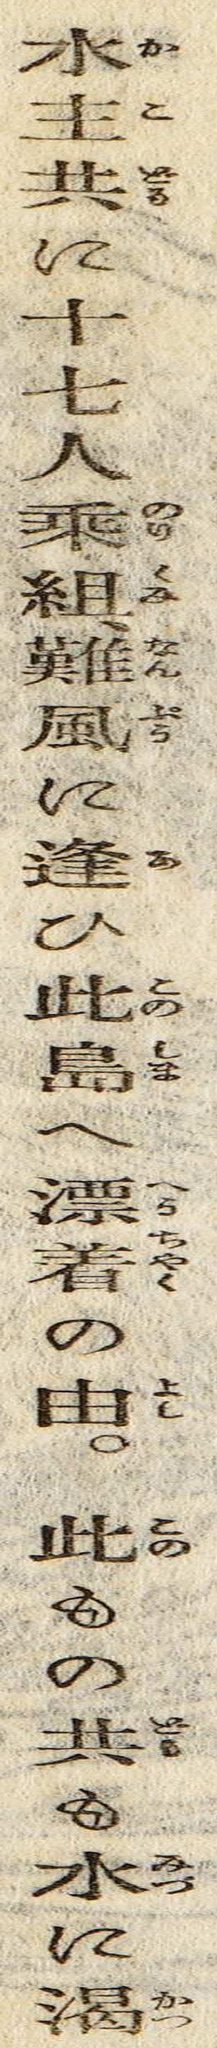水主共に十七人乗組、難風に逢ひ此島へ漂着の由。此もの共も水に渇
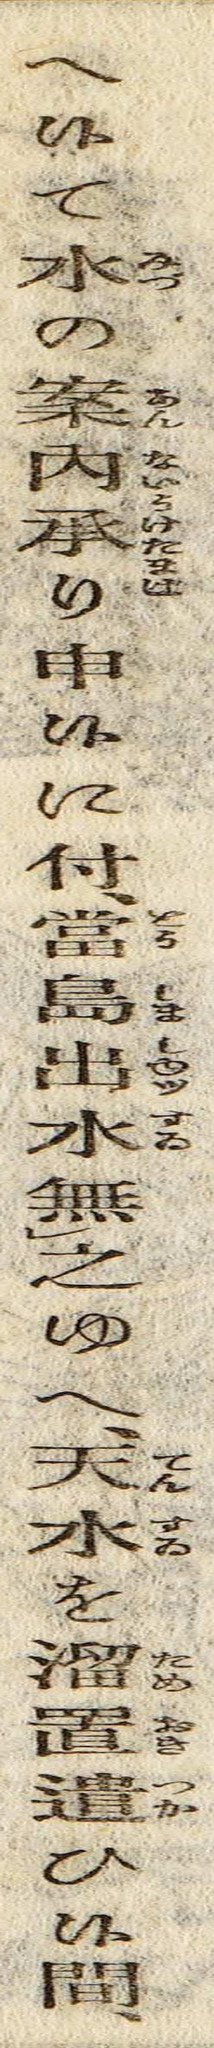へ候て水の案内承り申候に付、当島出水無之ゆへ、天水を溜置遣ひ候間、
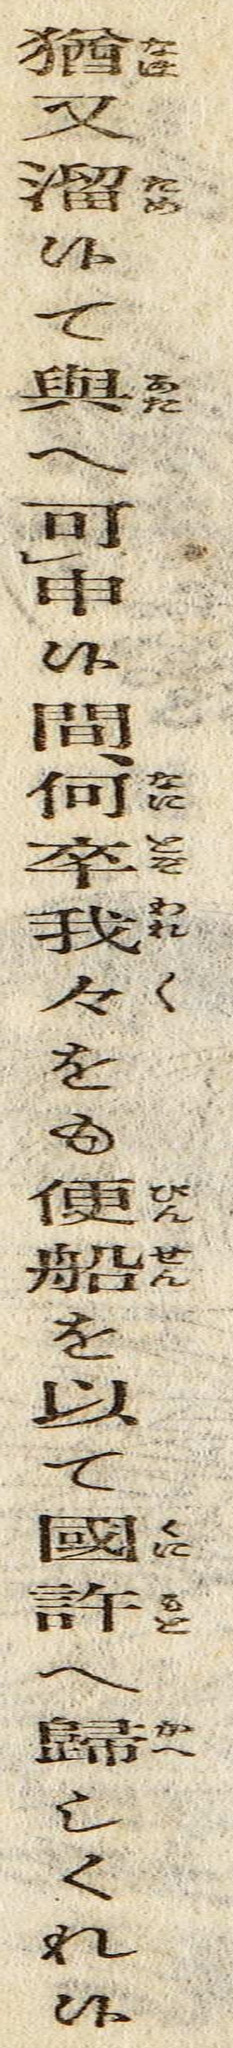猶又溜候て与へ可申候間、何卒我々をも便船を以て国許へ帰しくれ候
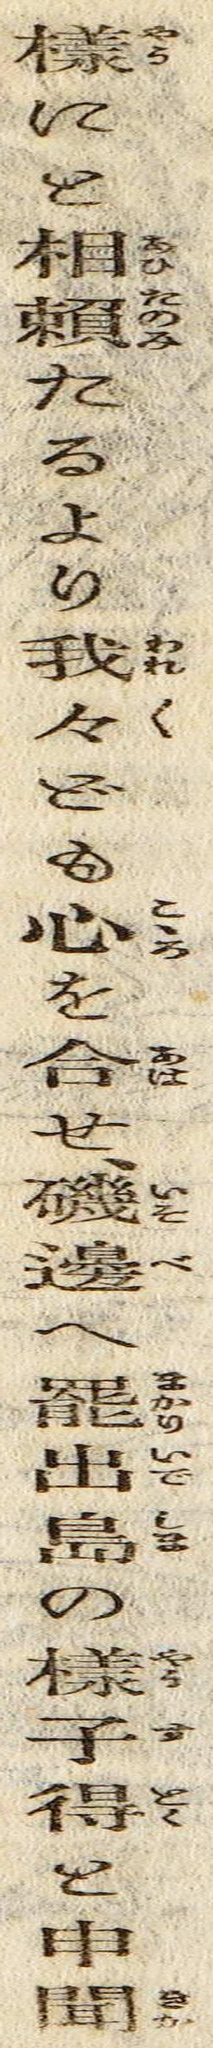様にと相頼たるより我々ども心を合せ、磯辺へ罷出島の様子得と、申聞
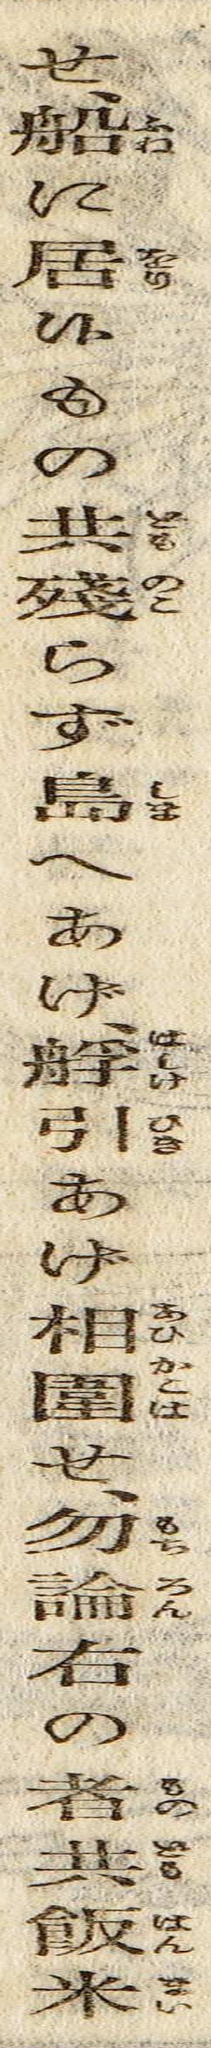せ、船に居候もの共残らず島へあげ、艀引あげ相囲せ、勿論右の者共飯米
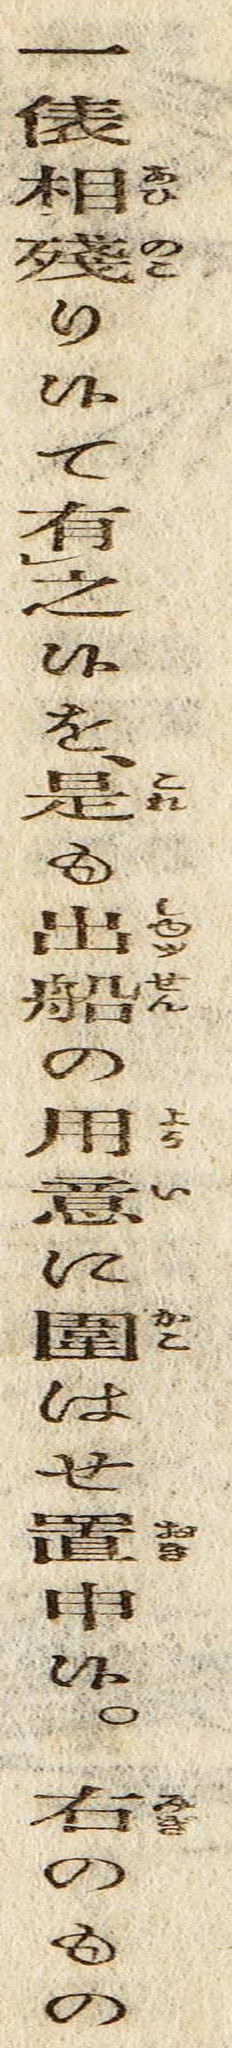一俵相残り候て有之候を、是も出船の用意に囲はせ置申候。右のもの
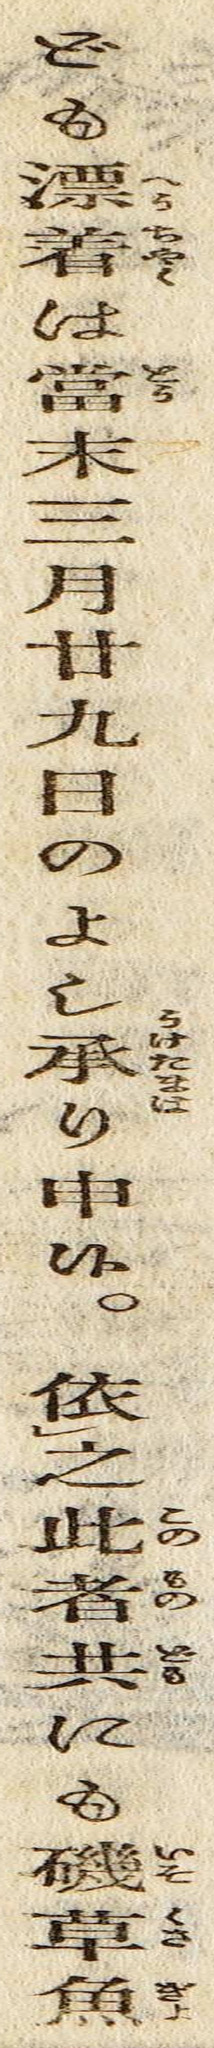ども漂着は当末三月廿九日のよし承り申候。依之此者共にも磯草魚
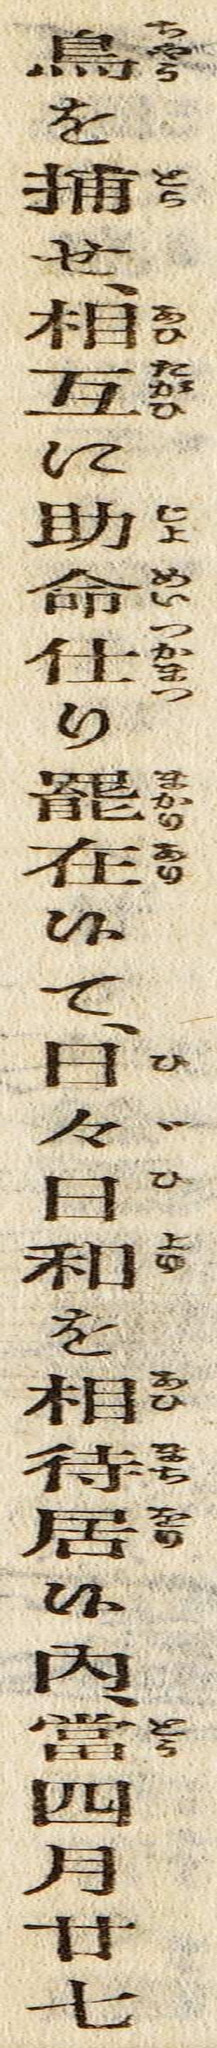鳥を捕せ、相互に助命仕り罷在候て、日々日和を相待居候内、当四月廿七
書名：日本漂流譚
